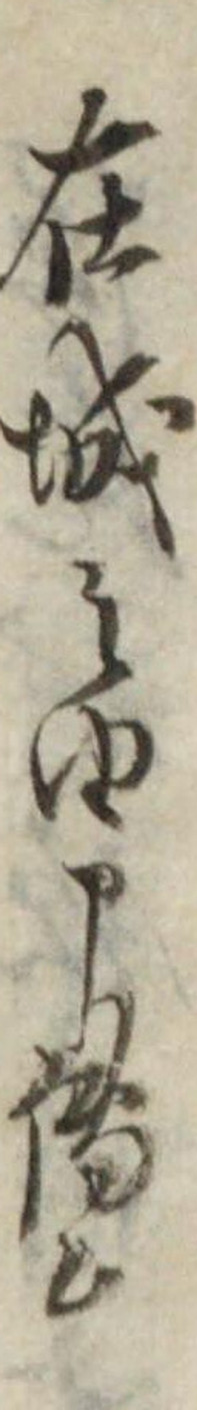在城之由申伝候
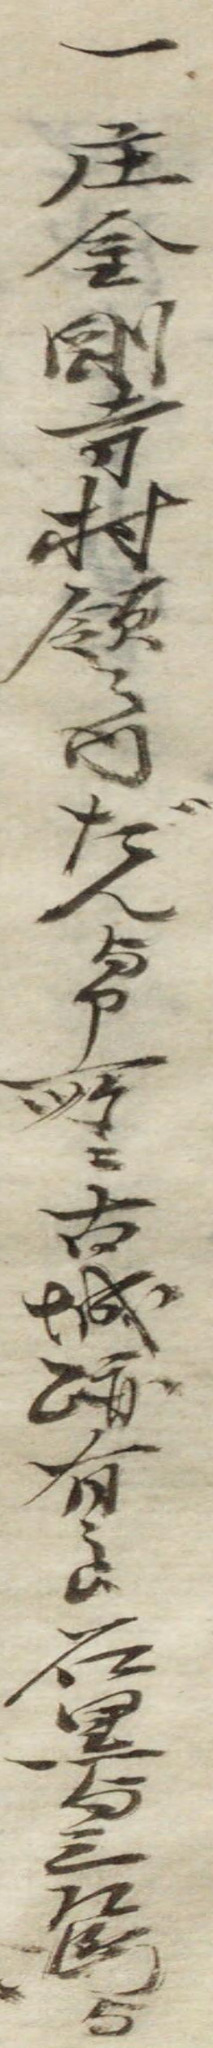一庄金剛寺村領之内だん与申所に古城跡有之候石黒与三左衛門与
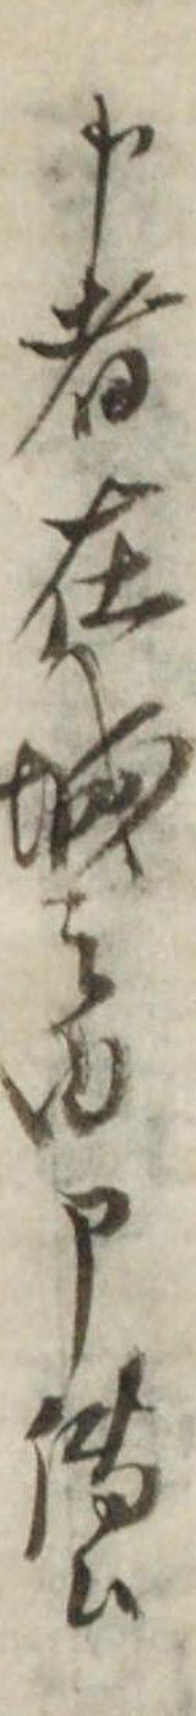申者在城の由申伝候
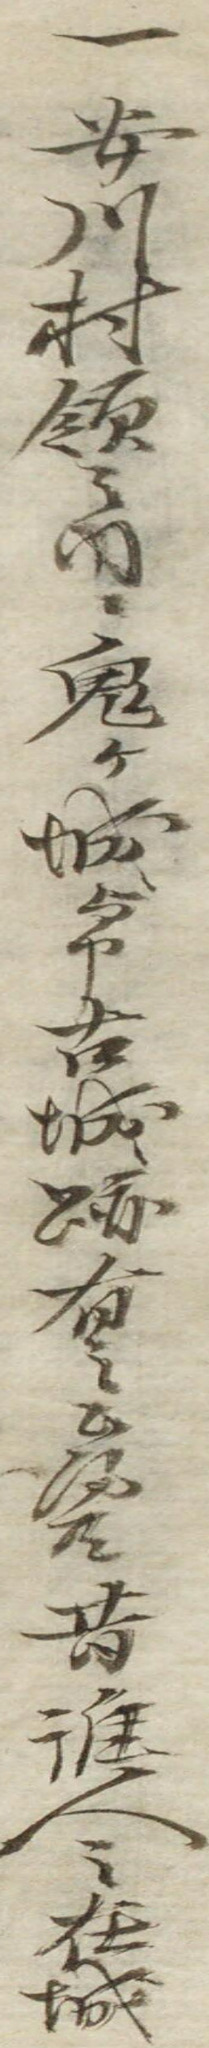一安川村領之内に鬼ヶ城与申古城跡有之候得共誰人之在城
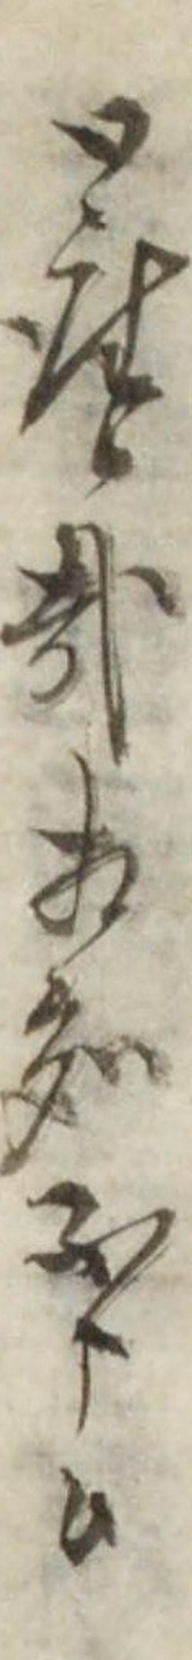御座候哉相知不申候
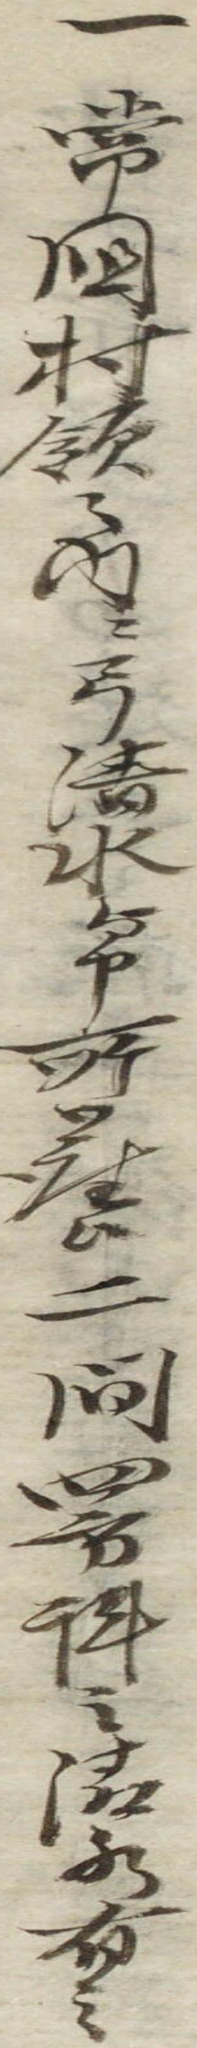一常国村領之内に弓清水与申所御座候二間四方許之清水有之
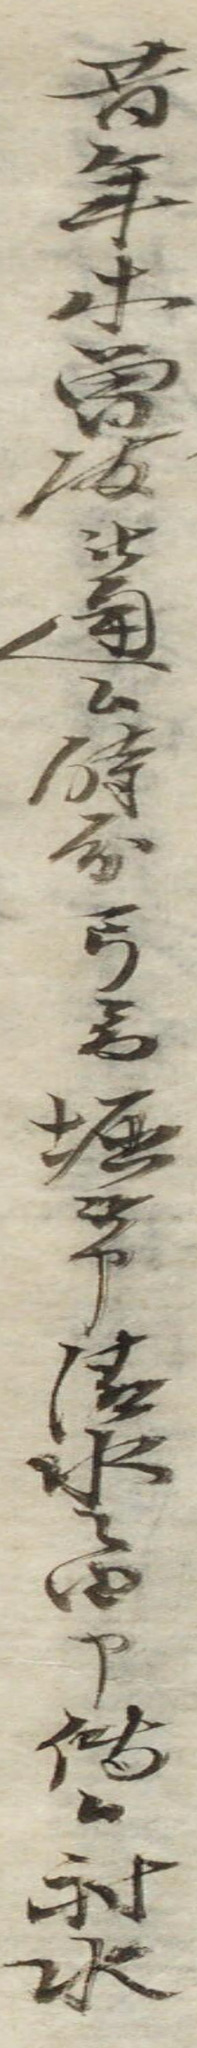昔年木曽殿被通候時分弓に而掘被申清水之由申伝候射水
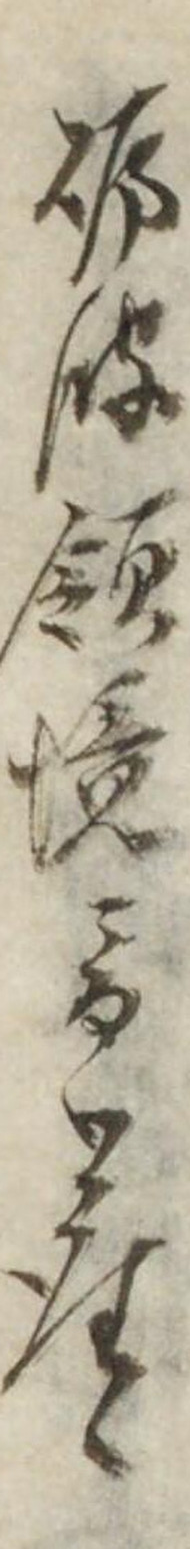砺波領酒井境に而御座候
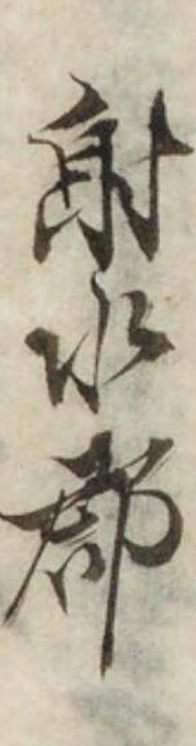射水郡
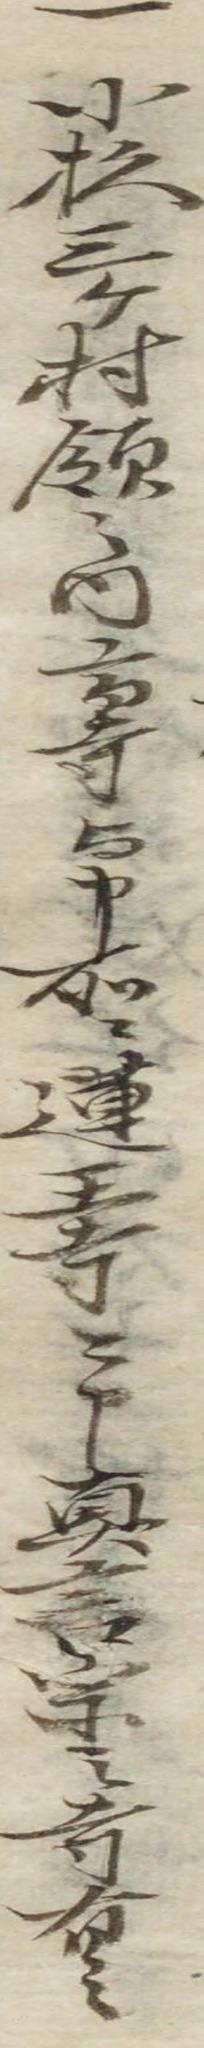一小杦三ヶ村領之内高寺与申所に蓮王寺と申真言宗之寺有之
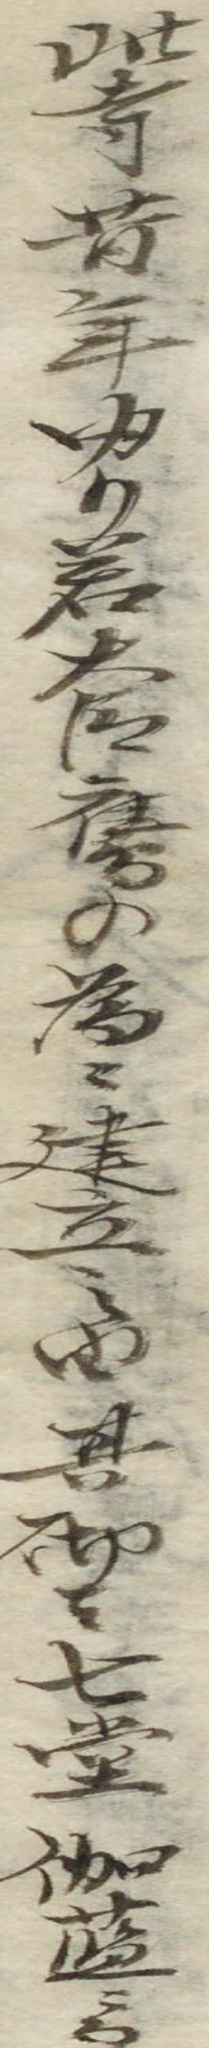此寺昔年ゆり若大臣鷹の為に建立之由其砌は七堂伽藍に而
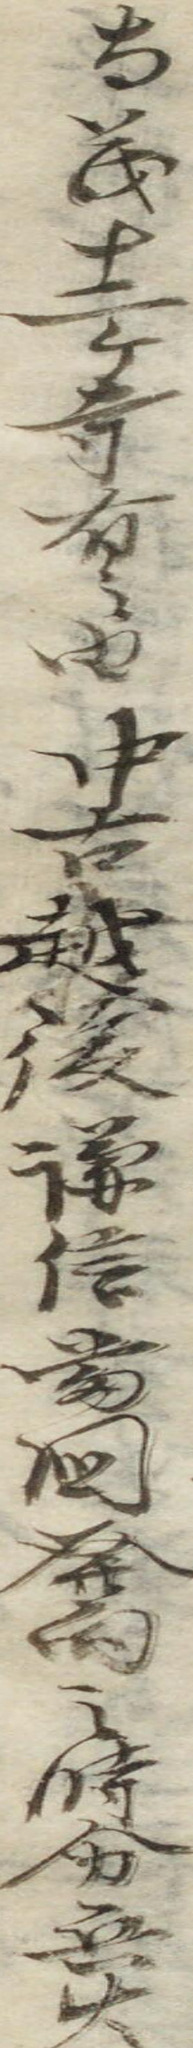寺も十二ヶ寺有之由中古越後謙信当国発向之時分兵火
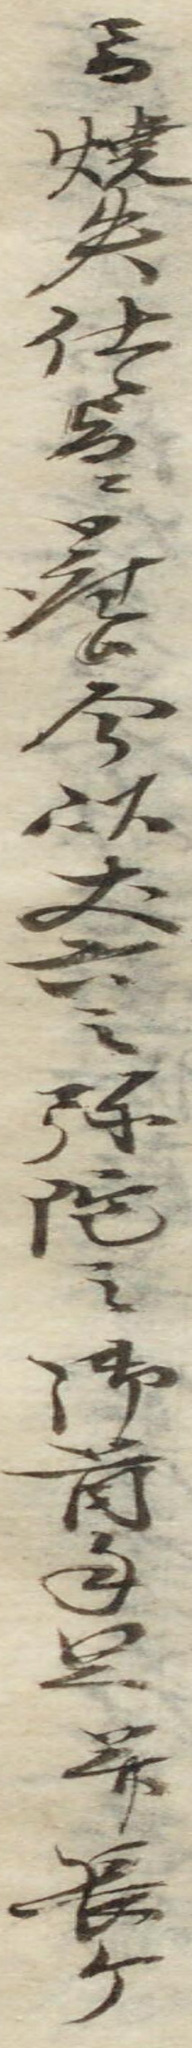に而焼失仕候旨に御座候今以丈六之弥陀之御首手足并長ヶ
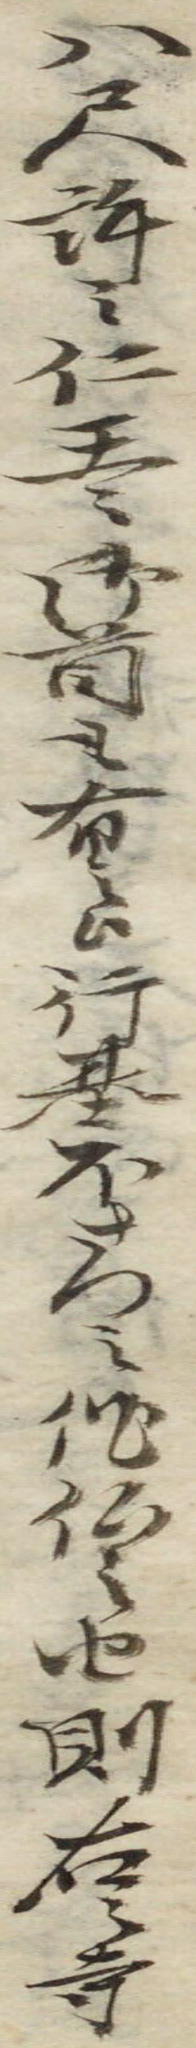八尺許之仁王之御首も有之候行基ほさつ之作仏之由則右之寺
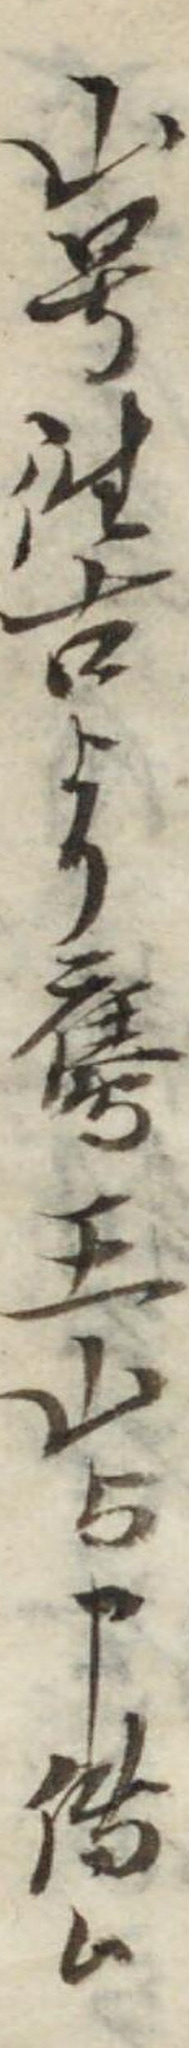山号往古より鷹王山与申伝候
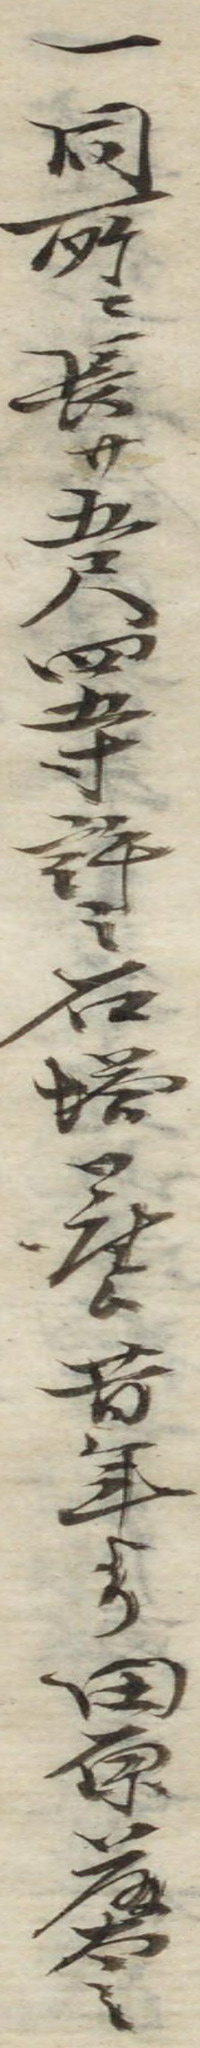一同所に長さ五尺四五寸許之石塔御座候昔年より田原藤太之
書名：加越能旧聞録
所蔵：Ishikawa Prefectural Library
